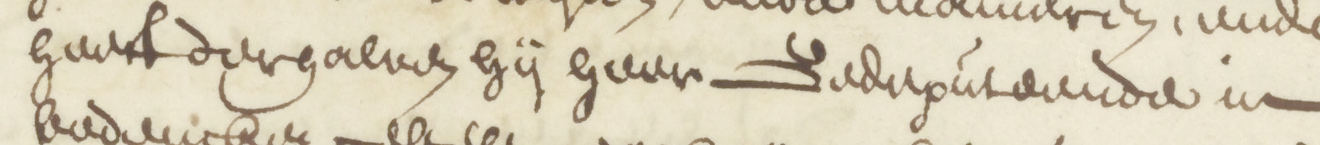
heeft derhalven hij heer Gedeputeerde in
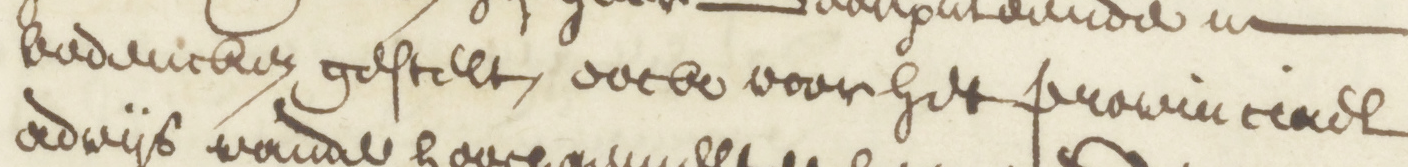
bedencken gestelt, oock voor het Provinciael
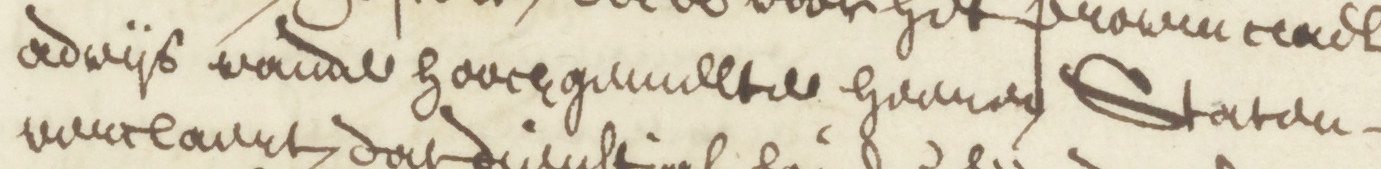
advijs vande hoochgemelte heeren Staten —
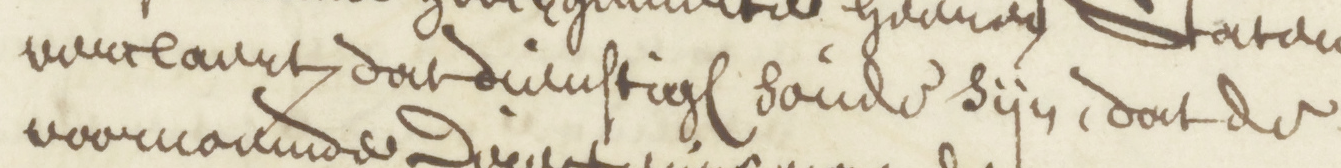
verclaert dat dienstigh soude sijn, dat de —
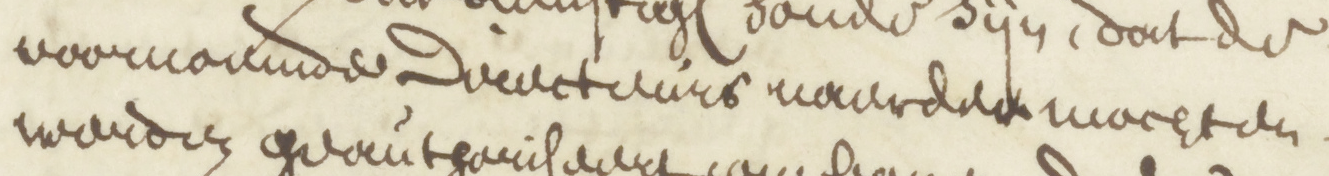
voornoemde Directeurs naerder mochten —
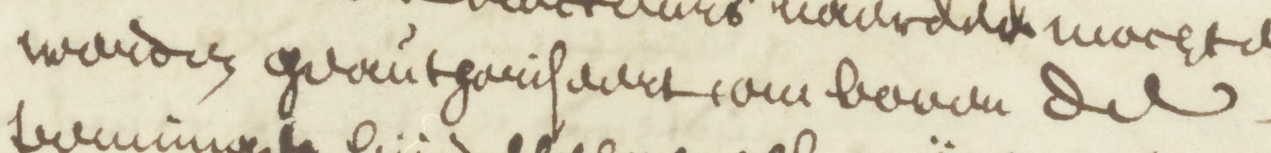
werden geauthoriseert, om boven de —
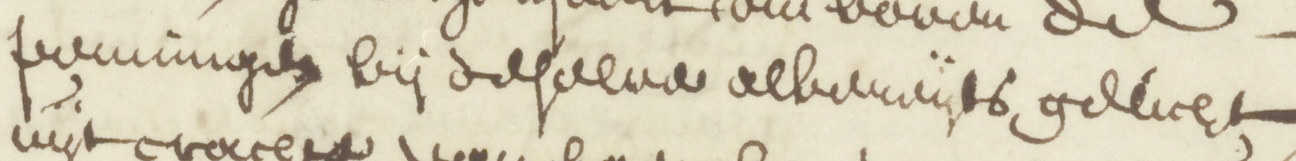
penningen bij deselve albereijts gelicht,
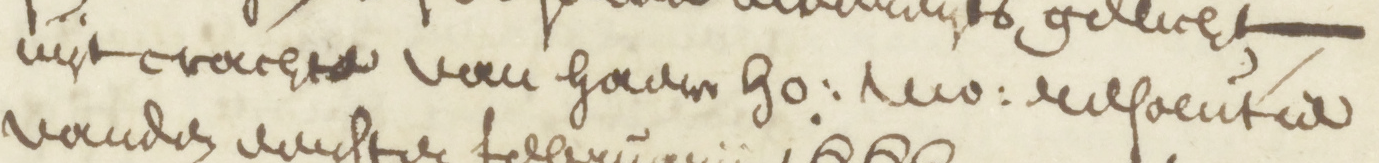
uijt crachte van haer Ho:Mo: resolutie
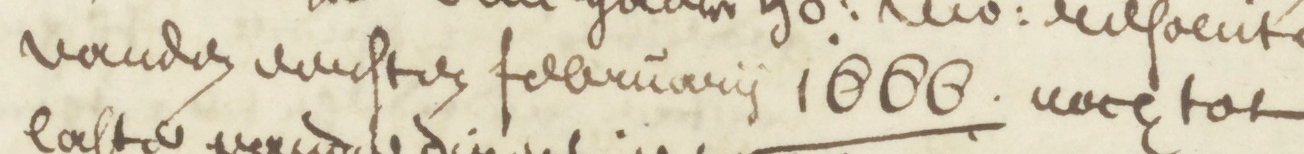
vanden eersten februarij 1666 noch tot
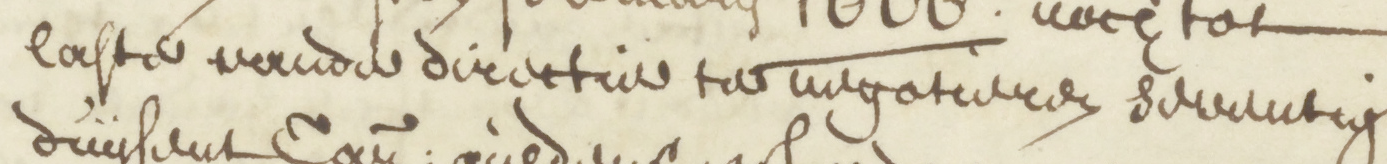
laste vande directie te negotieren seventigh
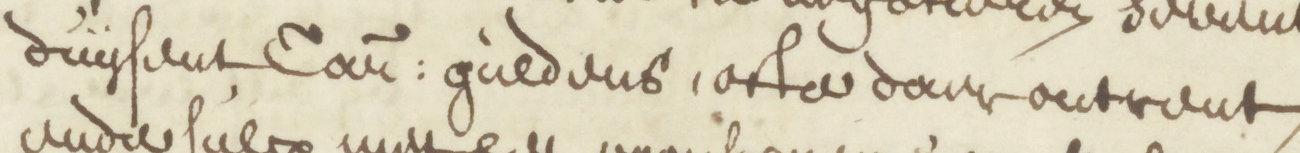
duijsent Car: guldens, ofte daer ontrent
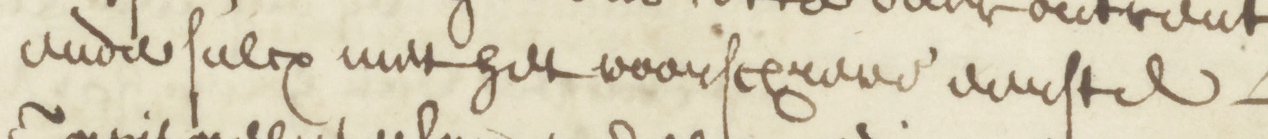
ende sulcx met het voorschreve eerste —
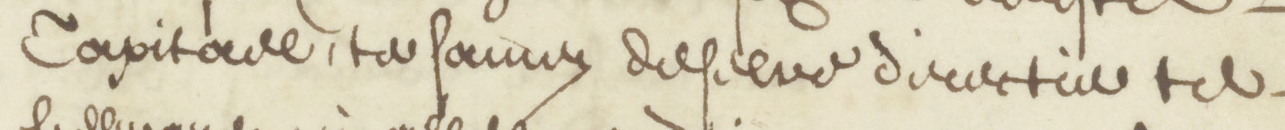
Capitael, te samen deselve directie te —
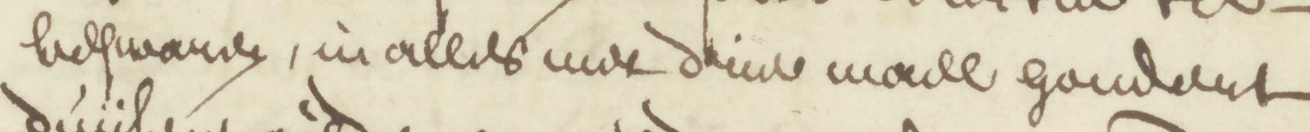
beswaren, in alles met drie mael hondert
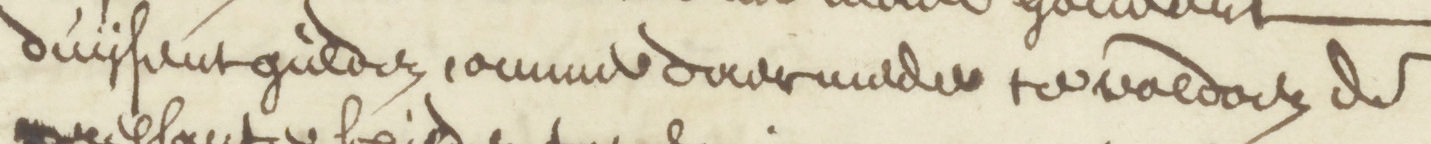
duijsent gulden, omme daermede te voldoen de
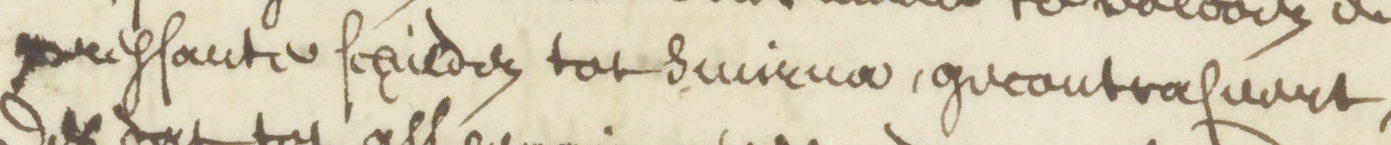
pressante schulden tot Smirna, gecontraheert.
